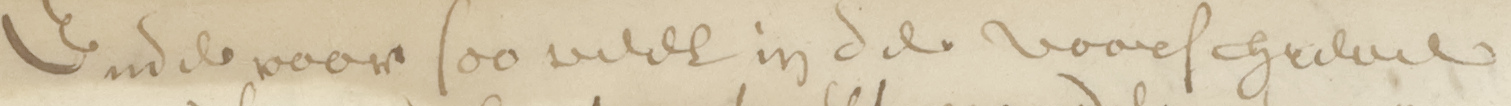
Ende voor soo veel in de voorschreve
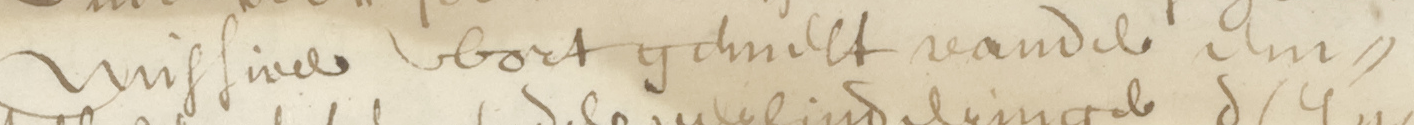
missive wort gemelt vande em„
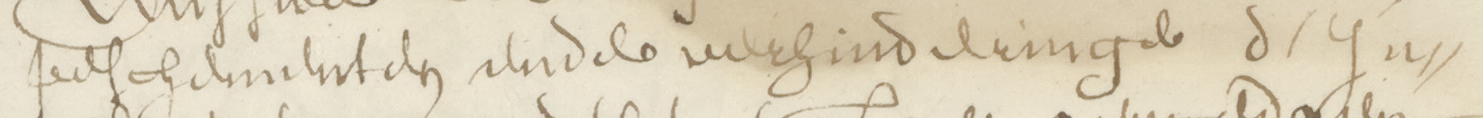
peschementen ende verhinderinge d'In,,
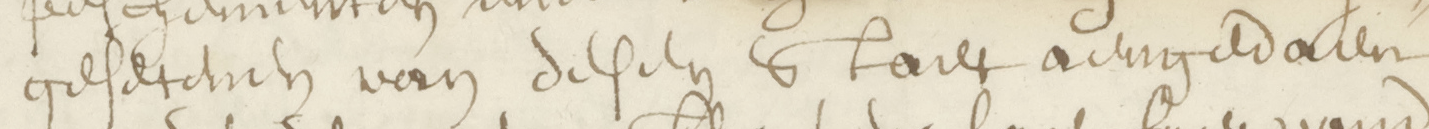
gesetenen van desen Staet aengedaen
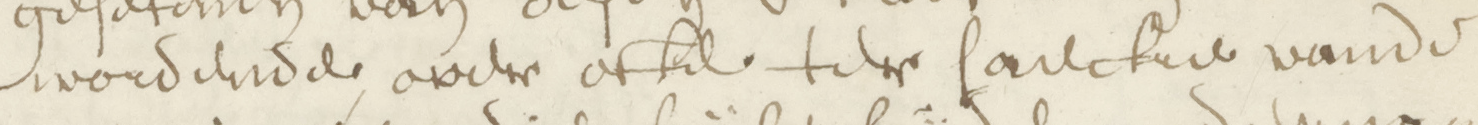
wordende, over ofte ter saecke vande
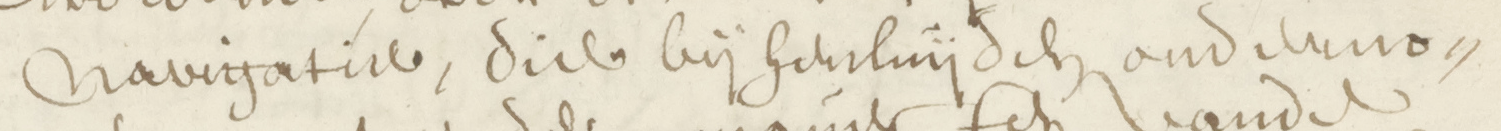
navigatie, die bij henluijden onderno,,
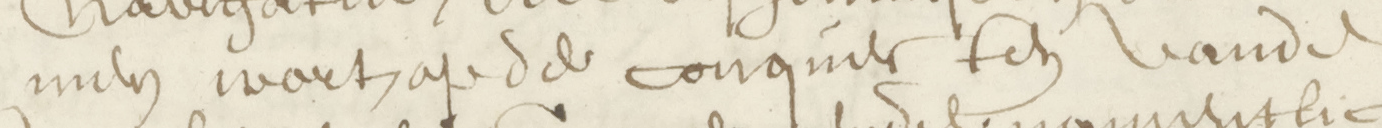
men wort, opde conquesten vande
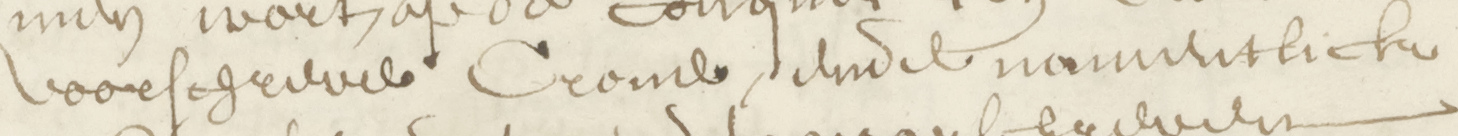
voorschreve Crone, ende namentlick
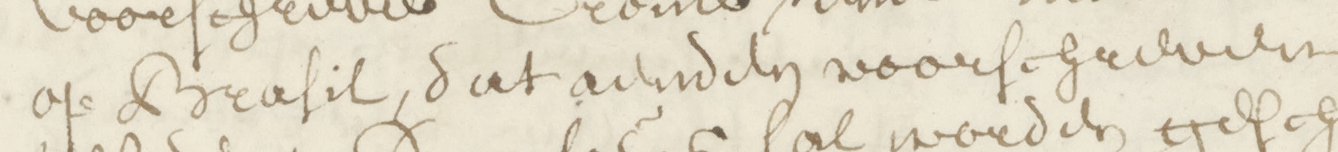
op Brasil, dat aenden voorschreven
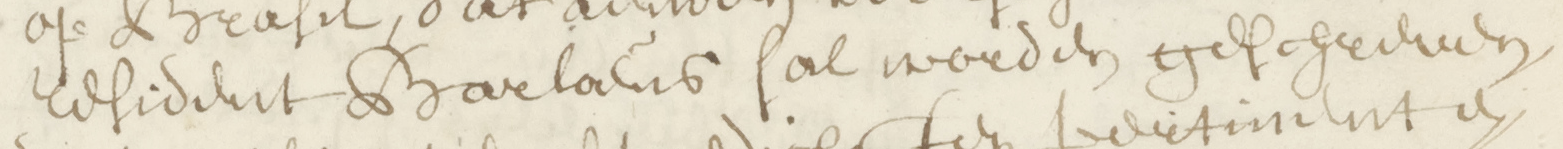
resident Barlaeus sal worden geschreven.
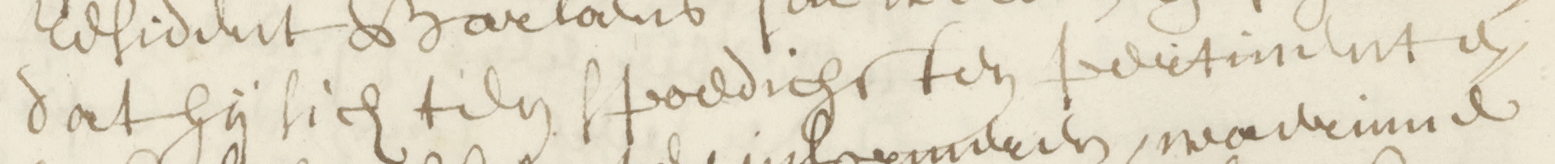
dat hij sich ten spoedichsten pertinente„
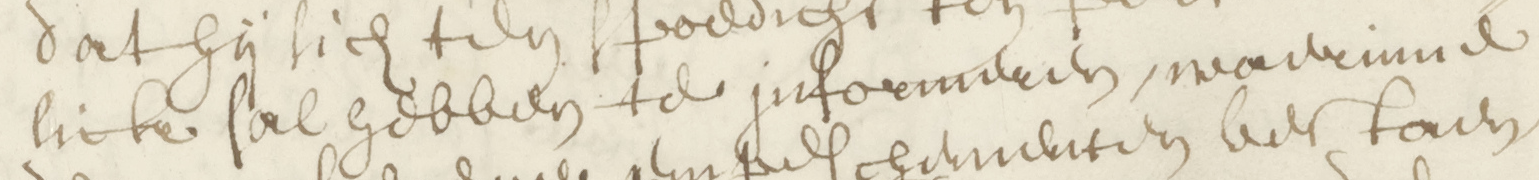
lick sal hebben te informeren, waerinne
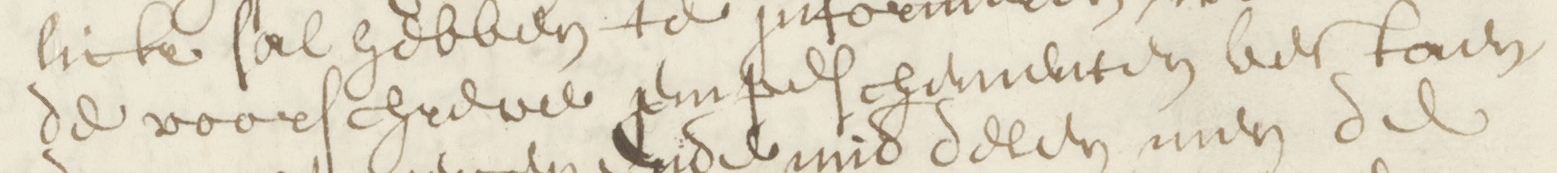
de voorschreve empeschementen bestaen,
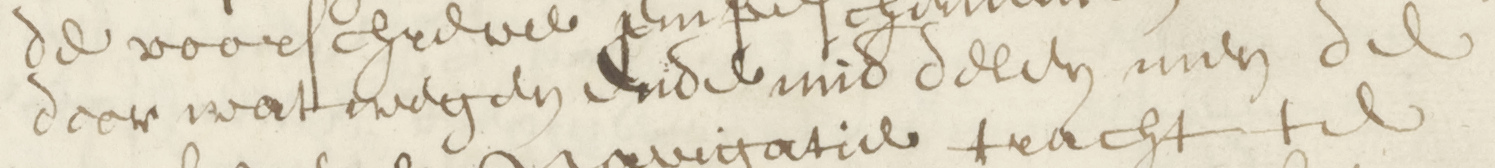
door wat wegen ende middelen men de
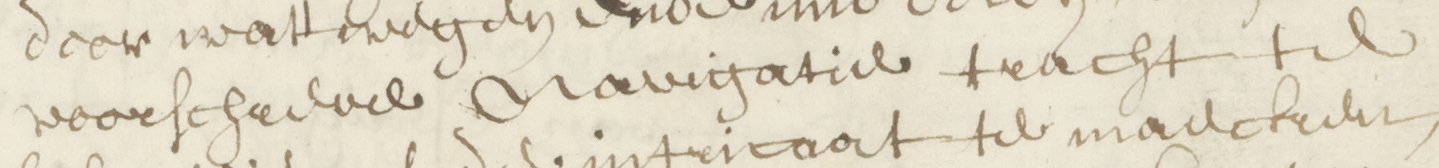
voorschreve navigatie tracht te
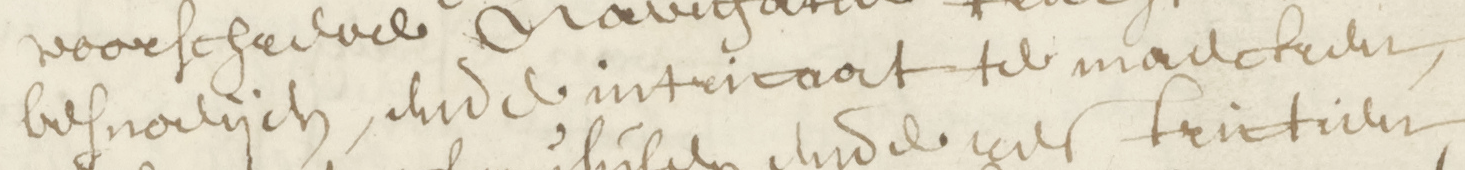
besnoeijen, ende intricaat te maecken,
